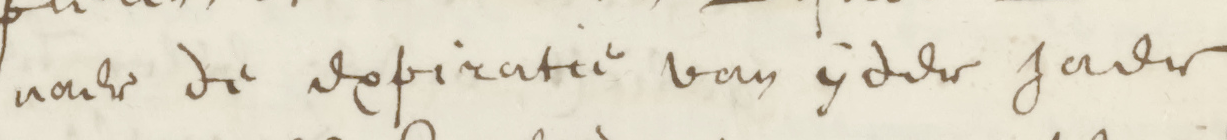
naer de expiratie van ijder jaer
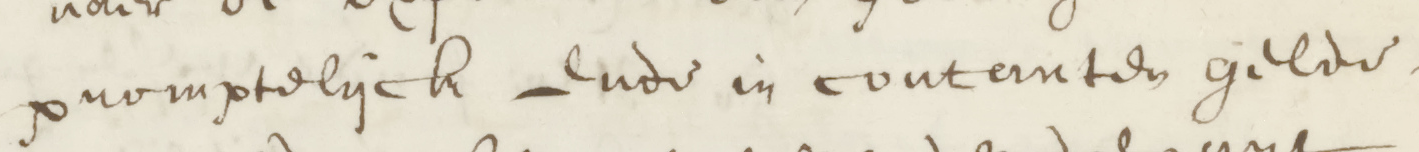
promptelijck ende in contanten gelde
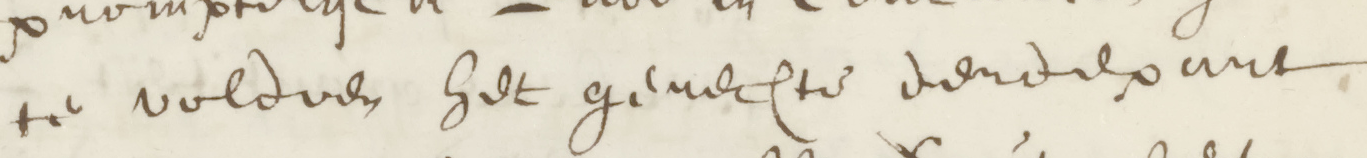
te voldoen het gerechte derdepart
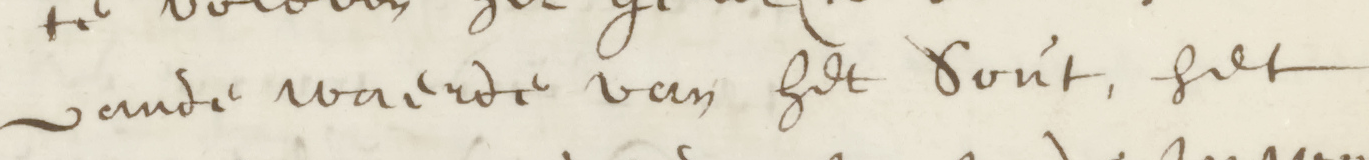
vande waerde van het Sout, het
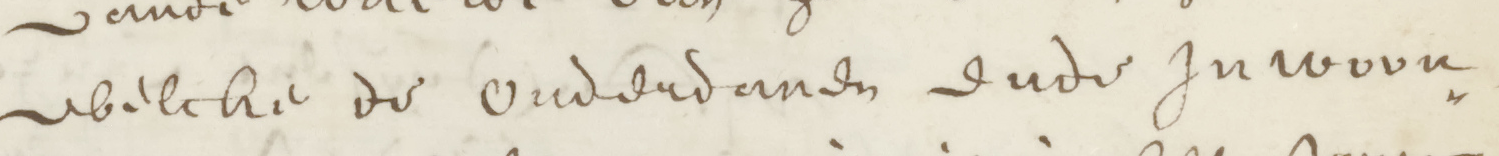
welcke de onderdanen ende Inwoon„
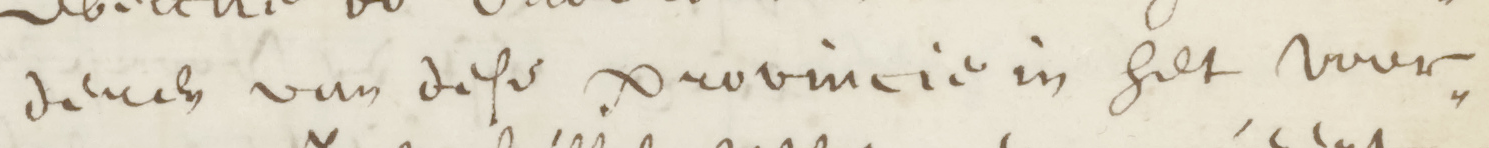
deren van dese provincie in het voor„
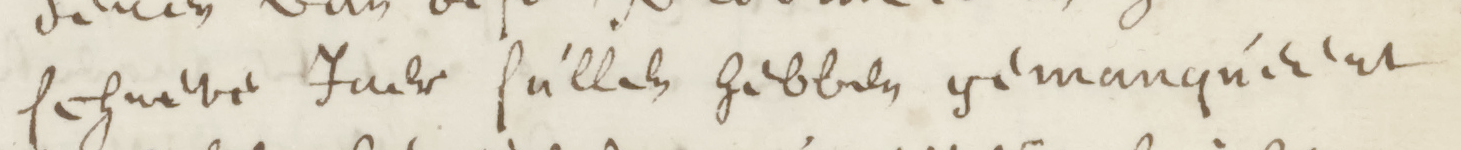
schreve Jaer sullen hebben gemanqueert
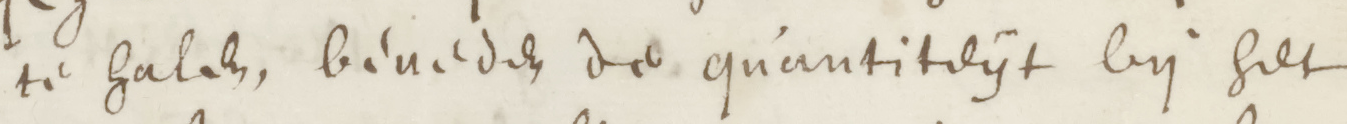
te halen, beneden de quantiteijt bij het
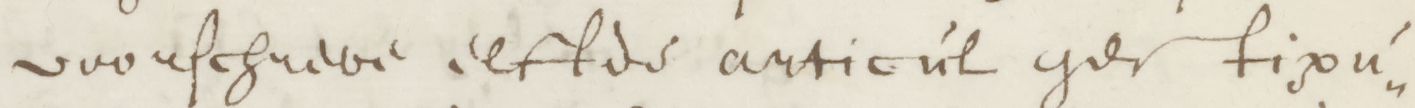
voorschreve elffde articul gestipu„
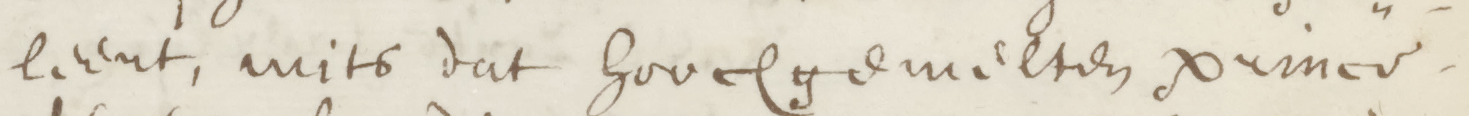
leert, mits dat hoochgemelten prince
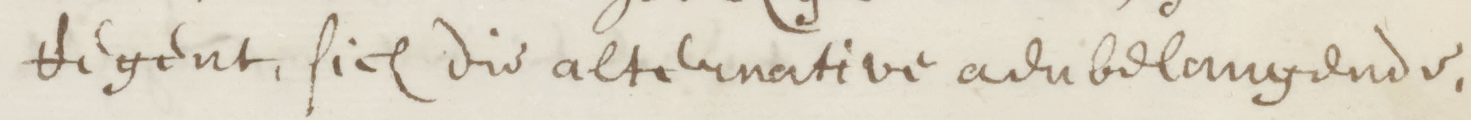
Regent, sich die alternative aen belangende.
